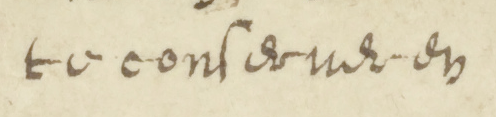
te conserueren
